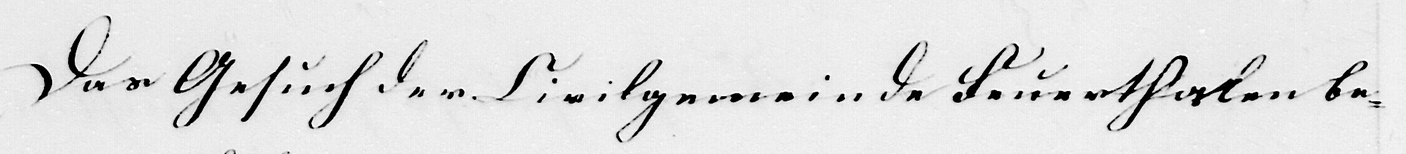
Das Gesuch der Civilgemeinde Feuerthalen be¬
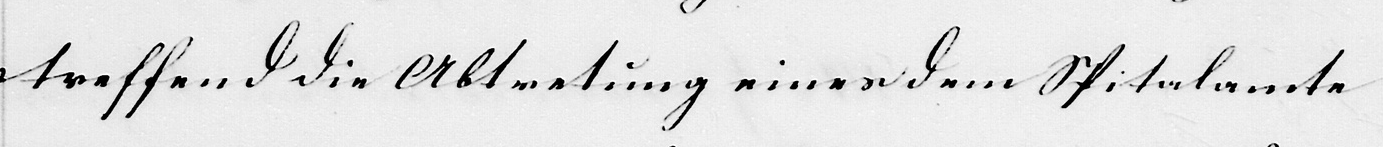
treffend die Abtretung eines dem Spitalamte
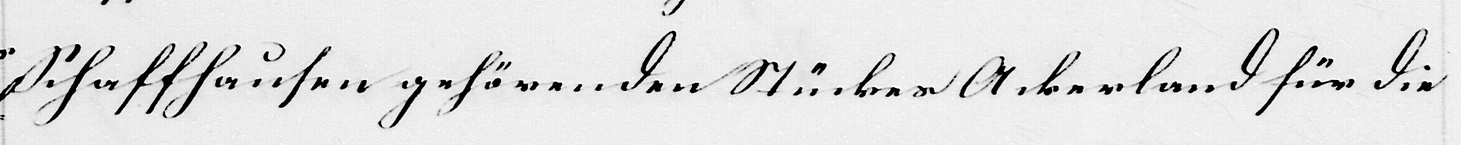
Schaffhausen gehörenden Stückes Ackerland für die
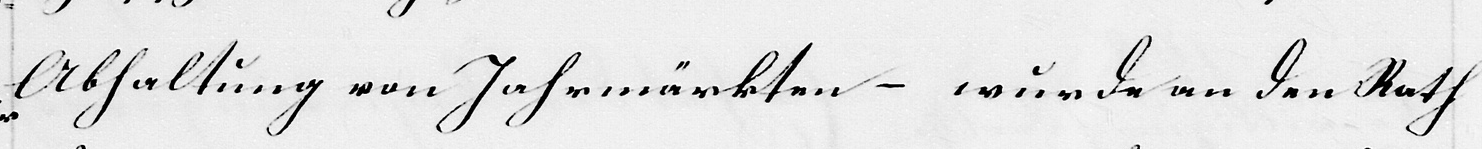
Abhaltung von Jahrmärkten – wurde an den Rath
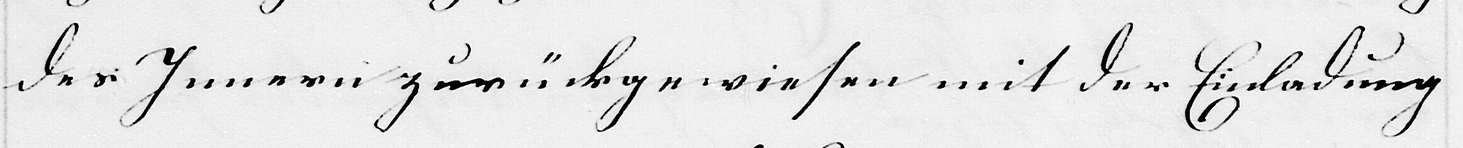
des Innern zurückgewiesen mit der Einladung
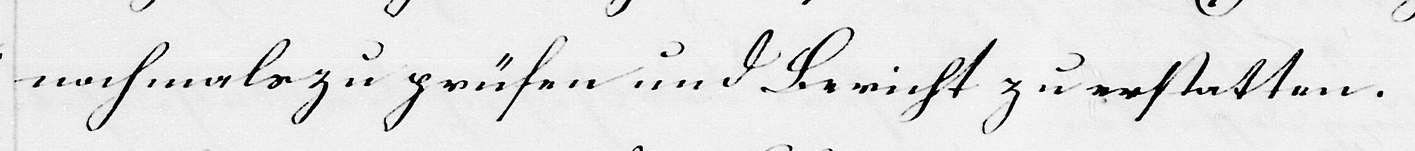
nochmals zu prüfen und Bericht zu erstatten.
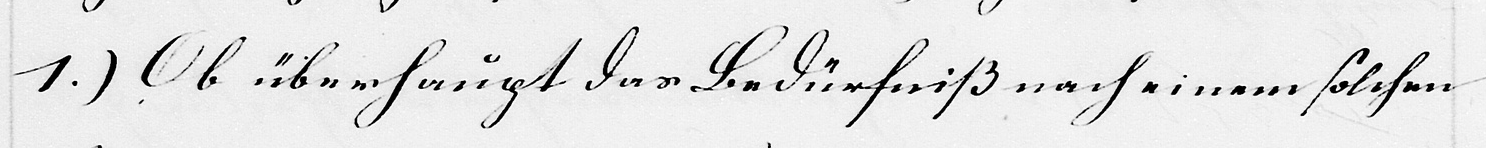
1.) Ob überhaupt das Bedürfniß nach einem solchen
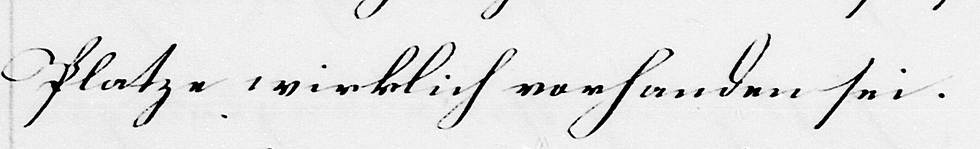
Platze wirklich vorhanden sei.
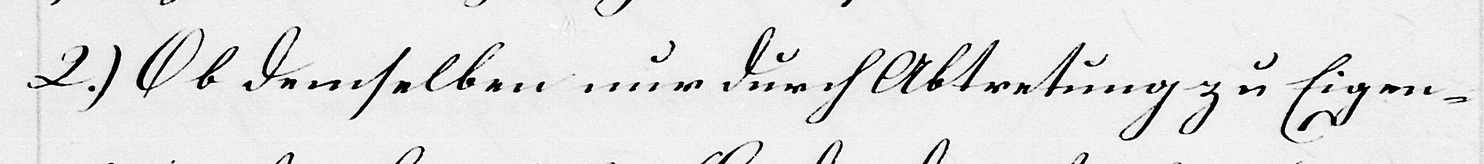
2.) Ob demselben nur durch Abtretung zu Eigen¬
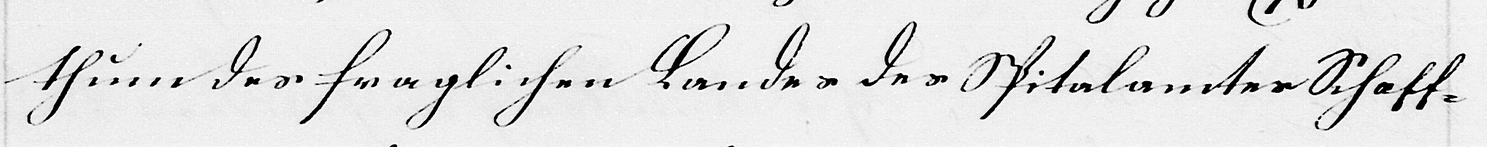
thum des fraglichen Landes des Spitalamtes Schaff¬
